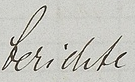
Berichte
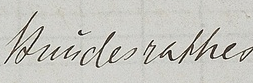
Bundesrathes
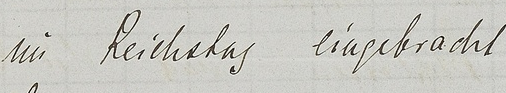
im Reichstag eingebracht
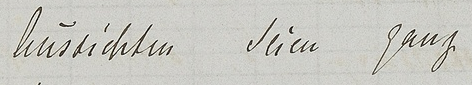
Aussichten seien ganz gut,
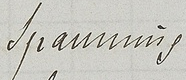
Spannung
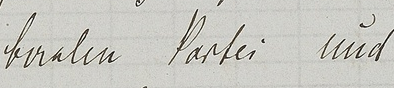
beralen Partei und
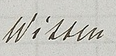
der Regierung.
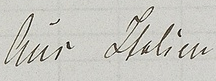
Aus Italien
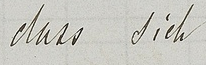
dass sich
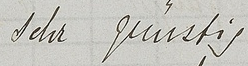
der Bauminister
